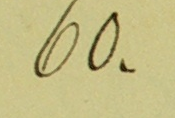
60
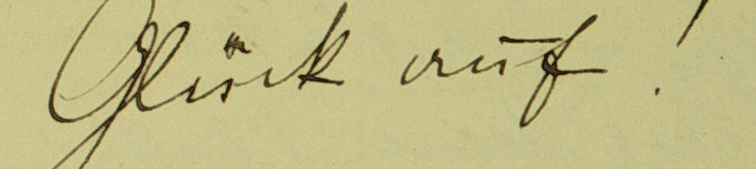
Glück auf !
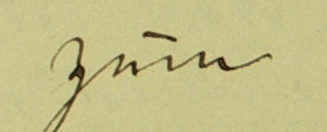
zum
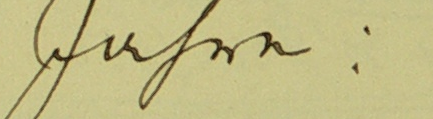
Jahre
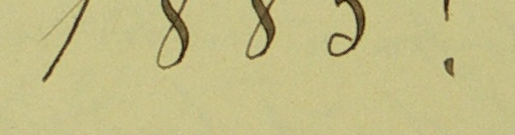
1883 !
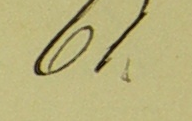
61
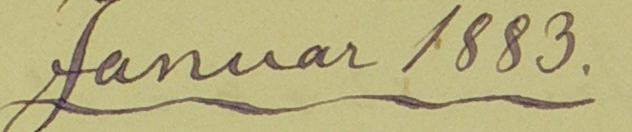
Januar 1883
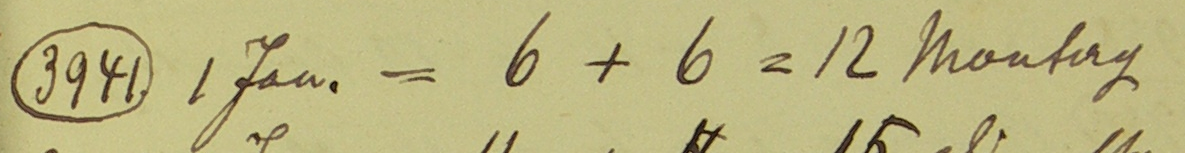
3941 1. Jan. = 6 + 6 = 12 Montag
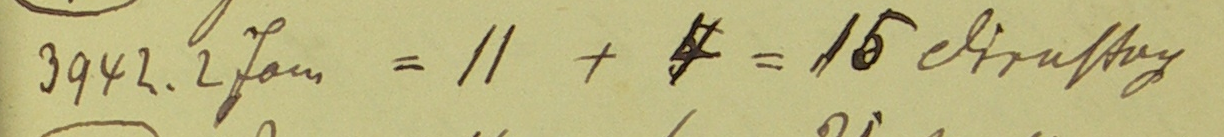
3942 2. Jan. = 11 + 4 = 15 Dienstag
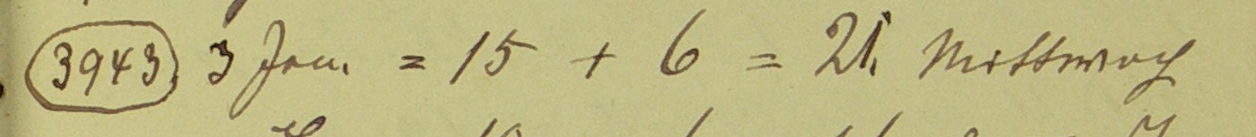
3943 3. Jan. = 15 + 6 = 25 Mittwoch
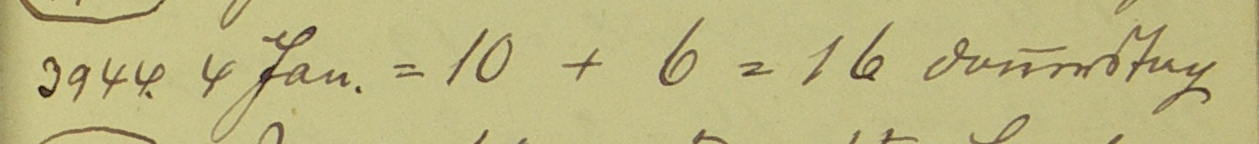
3944 4. Jan. = 10 + 6 = 16 Donnerst.
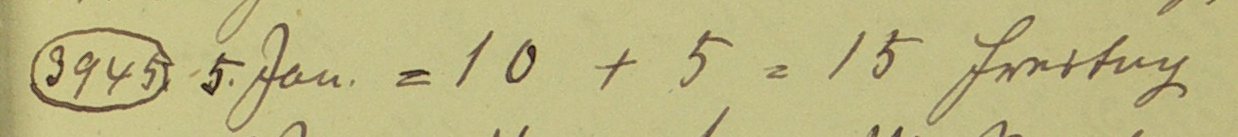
3945 5. Jan. = 10 + 5 = 15 Freitag
